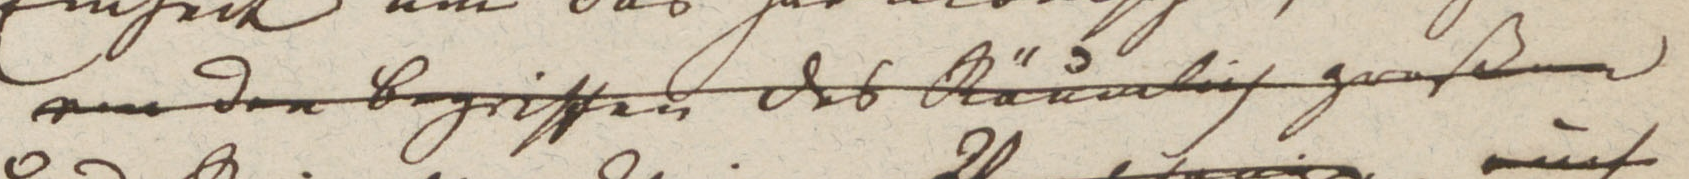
von den Begriffen des Räumlich grossen
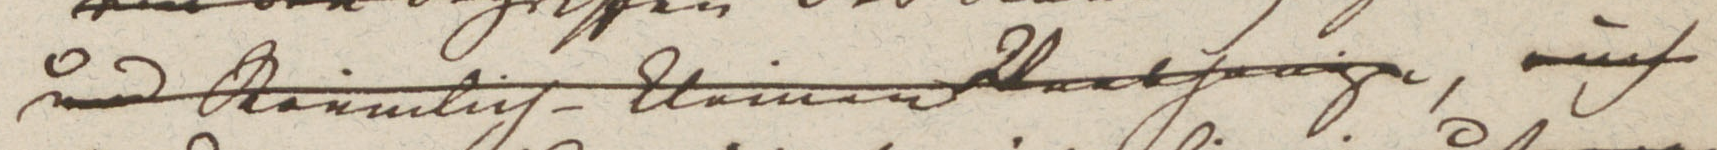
und Räumlich-Kleinen , auch
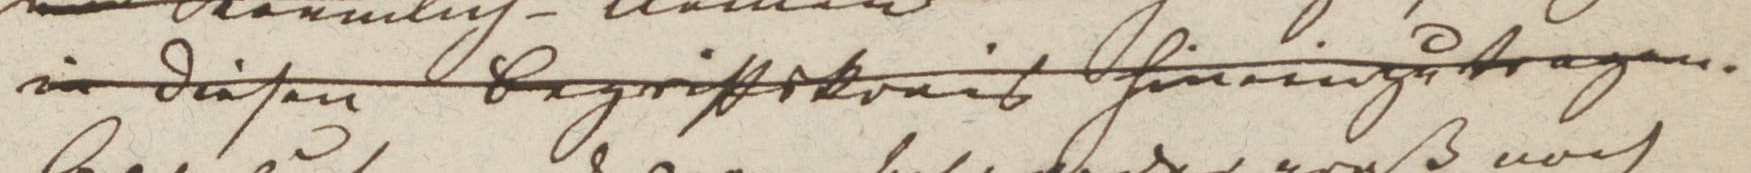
in diesen Begriffskreis hineinzutragen.
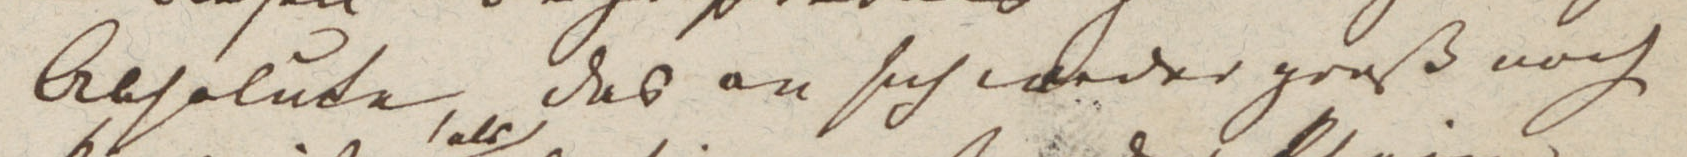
Absolute, das an sich weder gross noch
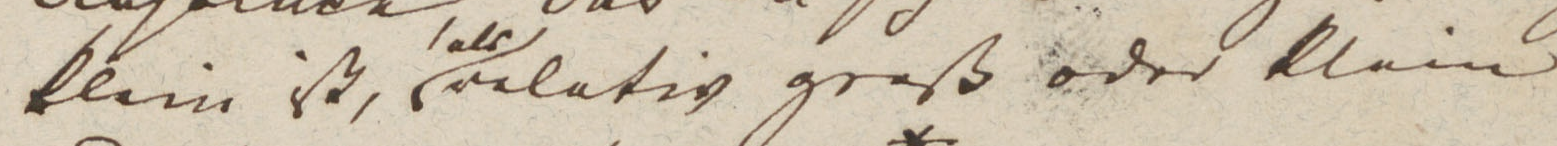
klein ist, als relativ gross oder klein
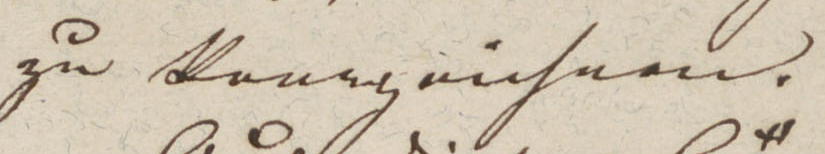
zu kennzeichnen. %
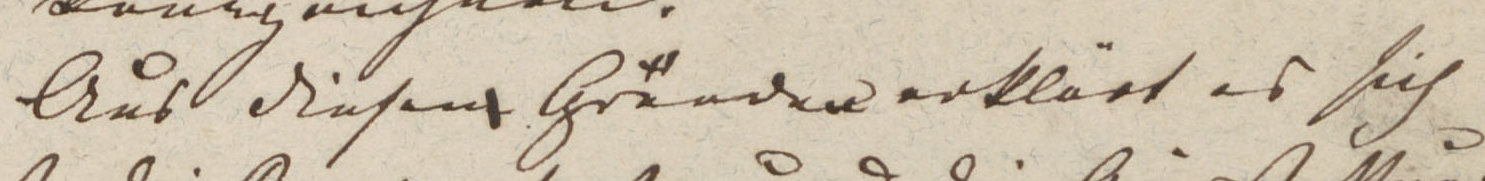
Aus diesemn Grüunden erklärt es sich
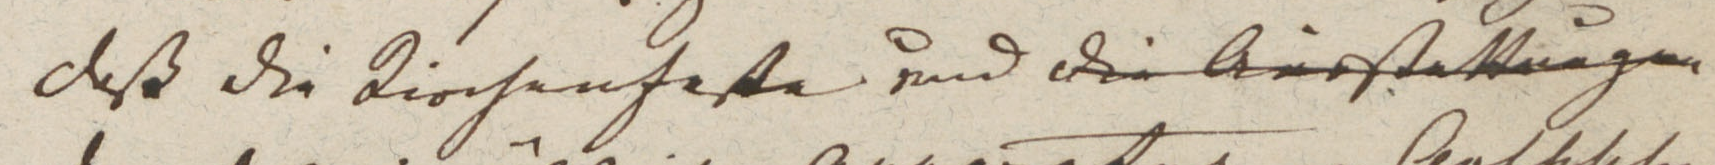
dass die Kirchenfeste und die Ausstattungen
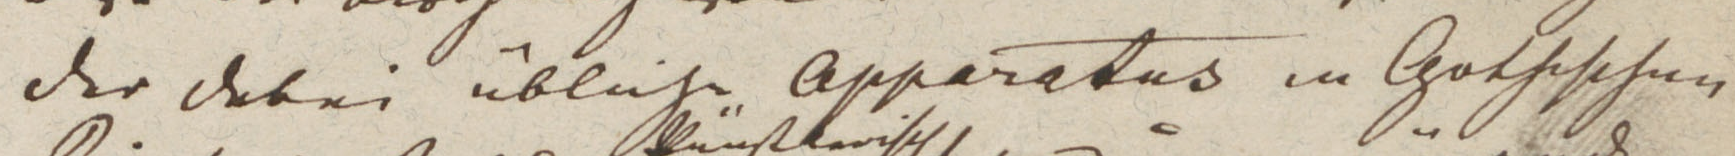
der dabei übliche Apparatus in Gothischen
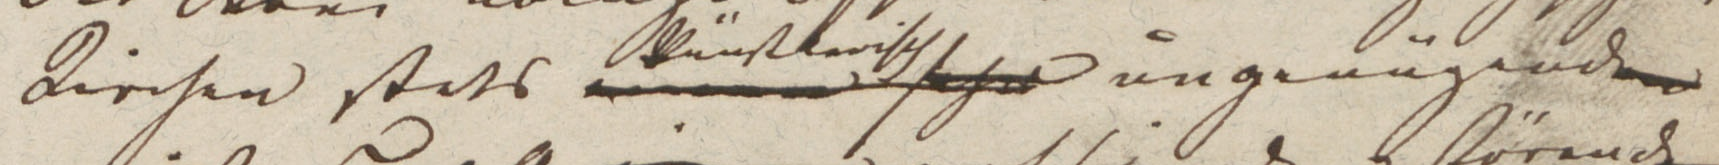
Kirchen stets eine sehr künstlerisch ungenügenden
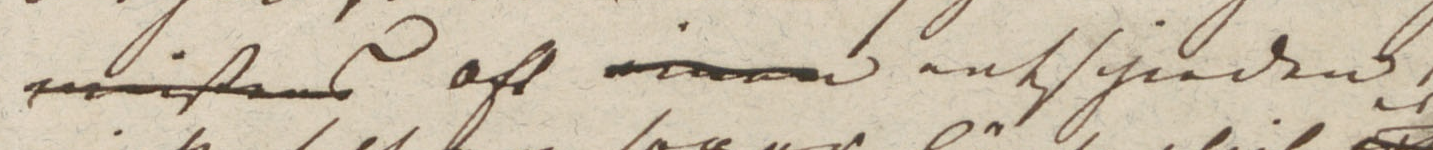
meistens oft einem entschieden
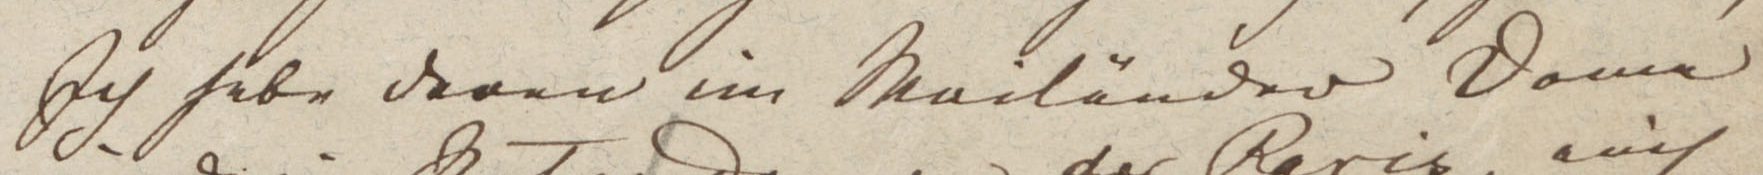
Ich habe deren im Mailänder Dome
